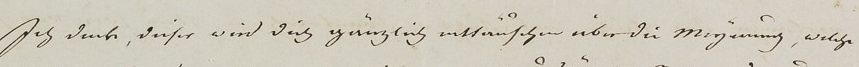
Ich denke, dieses wird Dich gänzlich enttäuschen über die Meynung, welche
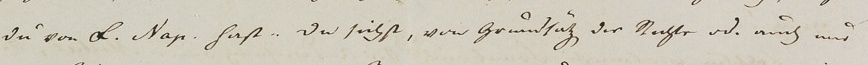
Du von L. Nap. hast. Du siehst, von Grundsätzen des Rechts od. auch nur
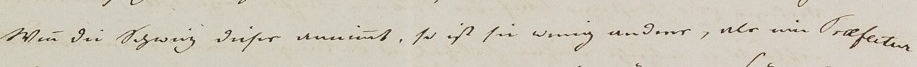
Wenn die Schweiz dieses annimmt, so ist sie wenig anderes, als eine Præfectur
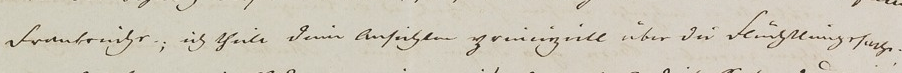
Frankreichs; ich theile Deine Ansichten principiell über die Flüchtlingssache;
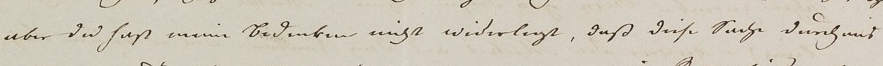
aber Du hast meine Bedenken nicht widerlegt, daß diese Sache durchaus
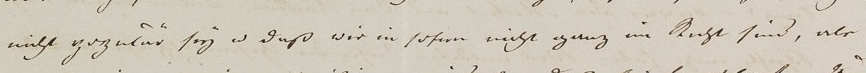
nicht populär sey u daß wir in sofern nicht ganz im Recht sind, als
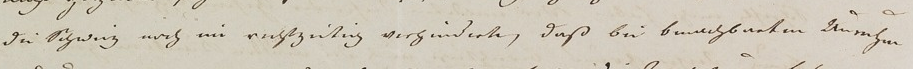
die Schweiz noch nie rechtzeitig verhinderte, daß bei benachbarten Unruhen
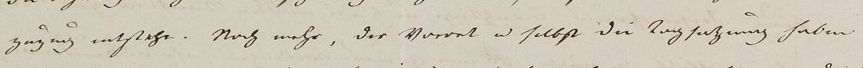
Zuzug entstehe. Noch mehr, der Vorort u selbst die Tagsatzung haben
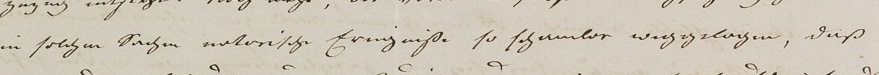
in solchen Sachen notorische Ereigniße so schamlos weggelogen, daß
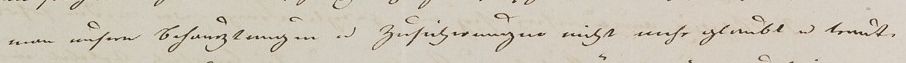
man unsern Behauptungen u Zusicherungen nicht mehr glaubt u traut.
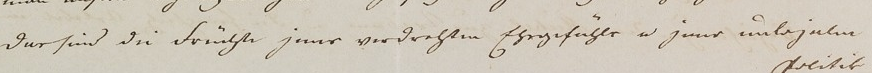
Das sind die Früchte jenes verdrehten Ehrgefühls u jener unlojalen
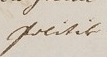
Politik.
